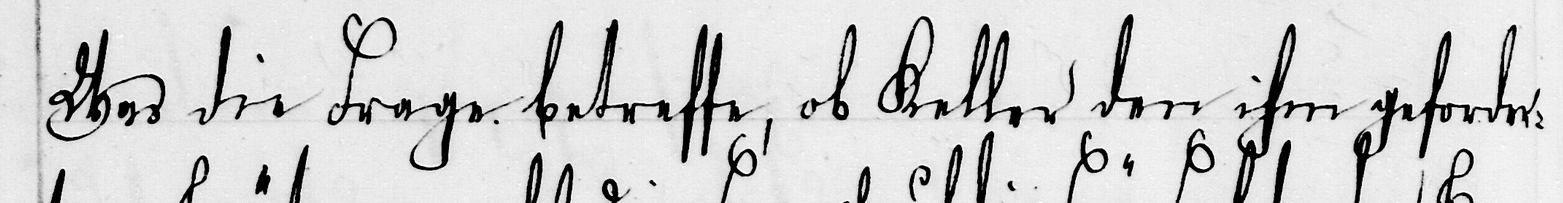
Was die Frage betreffe, ob Keller den ihm geforde¬
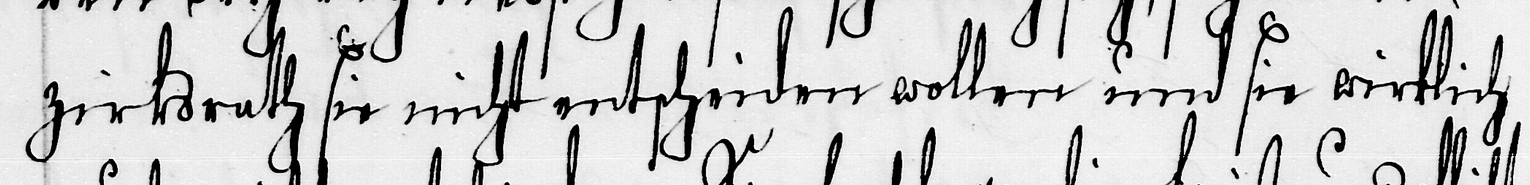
zirksrath sie nicht entscheiden wollen und sie wirklich
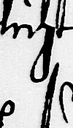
die
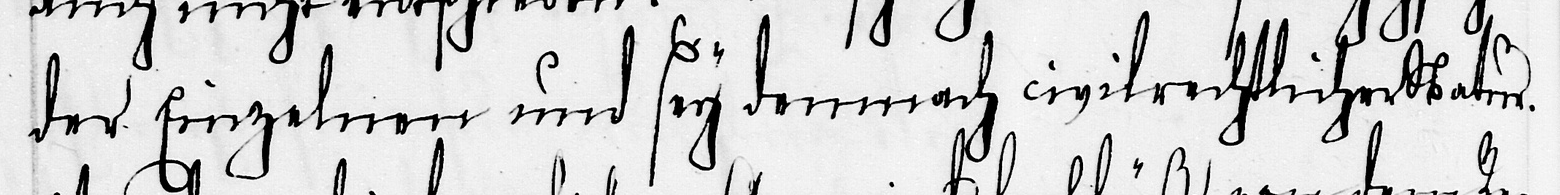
der Einzelnen und sey demnach civilrechtlicher Natur.
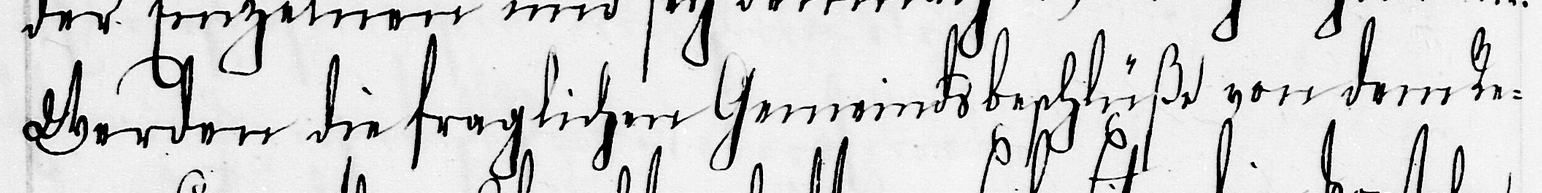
Werden die fraglichen Gemeindsbeschlüße von dem Re¬
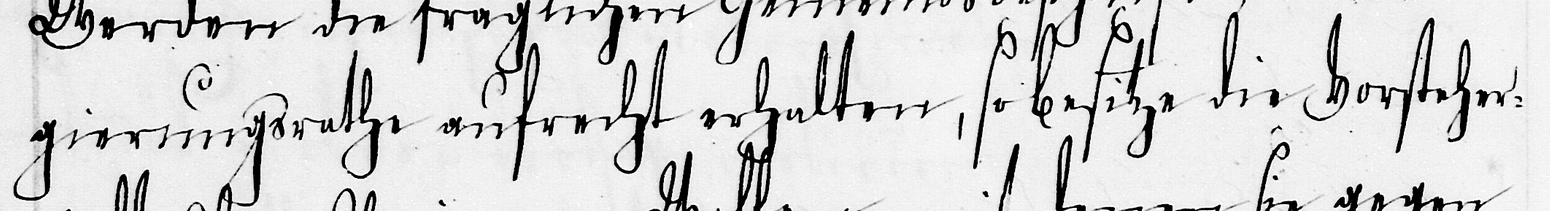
gierungsrathe aufrecht erhalten, so besitze die Vorsteher¬
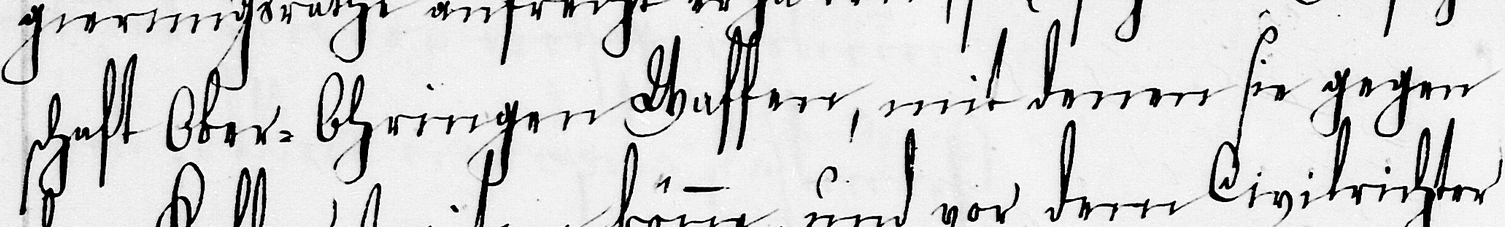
schaft Ober-Ohringen Waffen, mit denen sie gegen
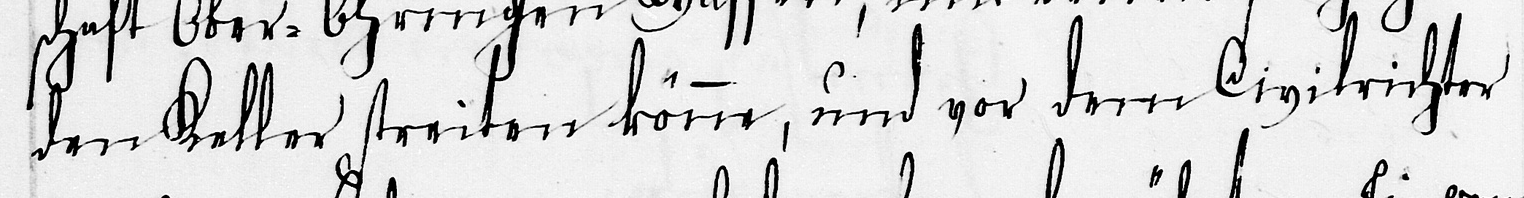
den Keller streiten könne, und vor dem Civilrichter
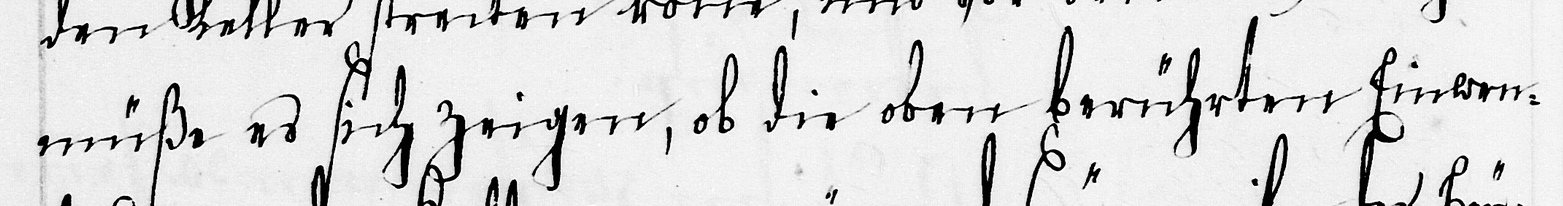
müße es sich zeigen, ob die oben berührten Einwen¬
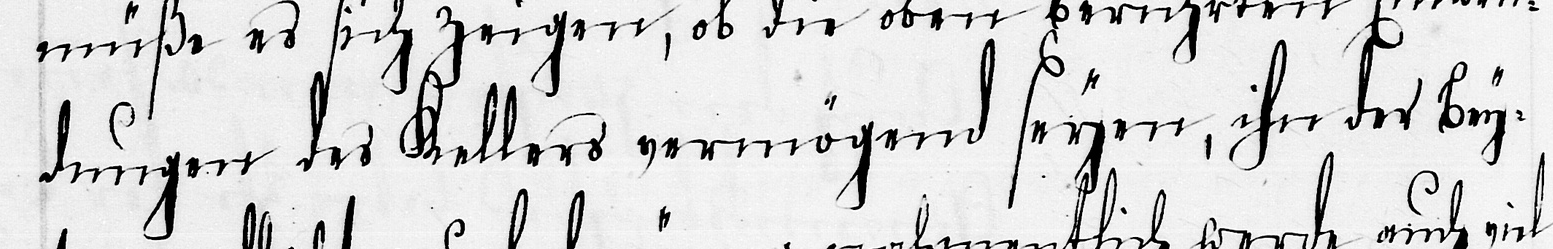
dungen des Kellers vermögend seyen, ihn der Bey¬
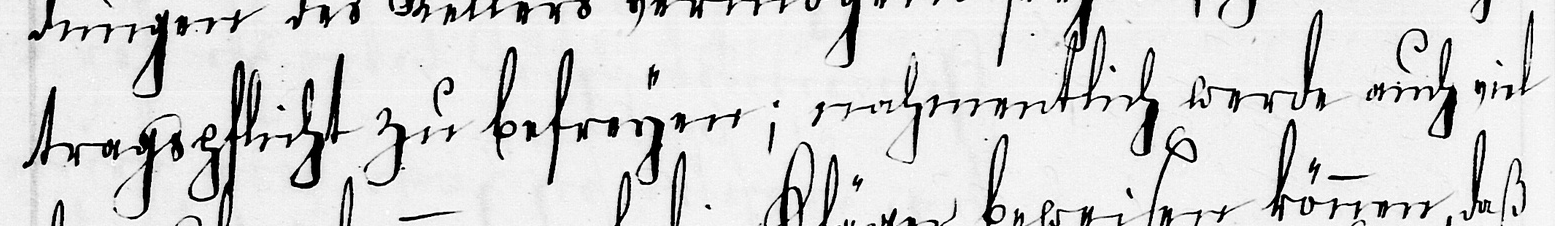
tragspflicht zu befreyen; nahmentlich werde auch vi¬
